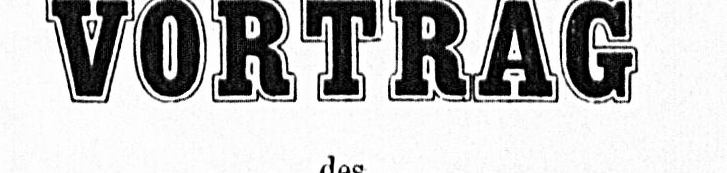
VORTRAG
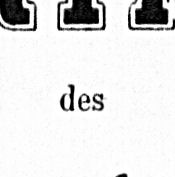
des
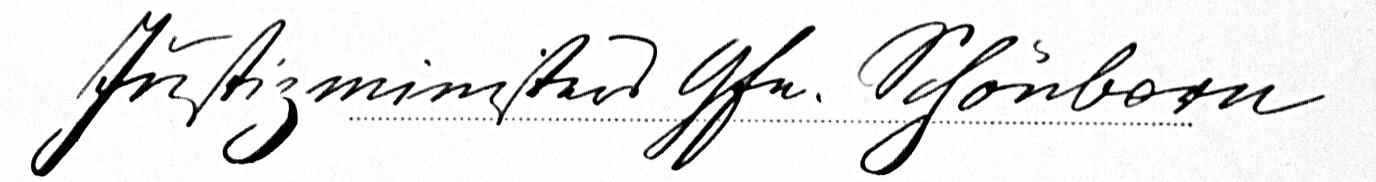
Justizministers Gfe. Schönborn
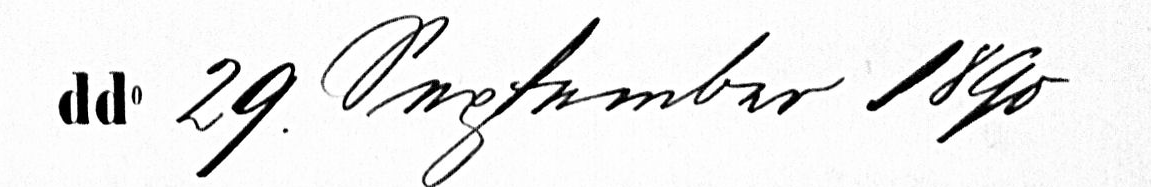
dd° 29. September 1890
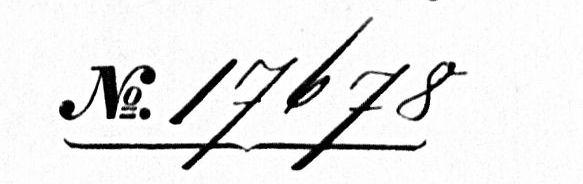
N° 17678
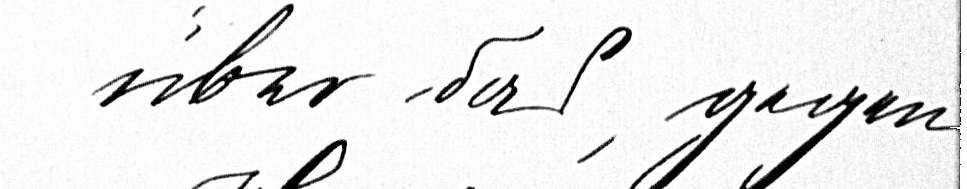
über das, gegen
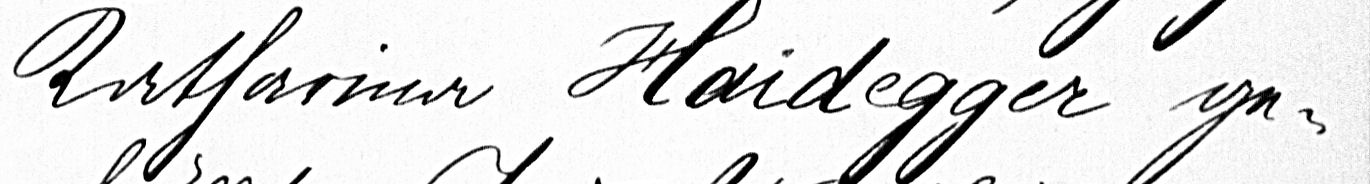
Katharina Haidegger ge¬
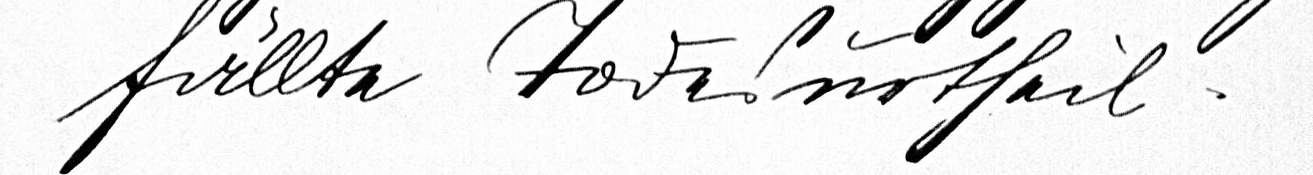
fällte Todesurtheil.
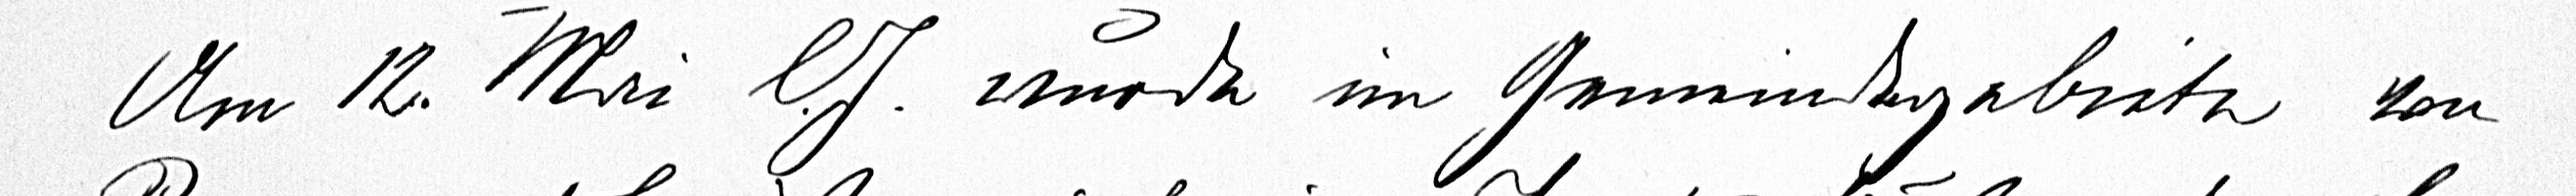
Am 12. Mai l.J. wurde im Gemeindegebiete von
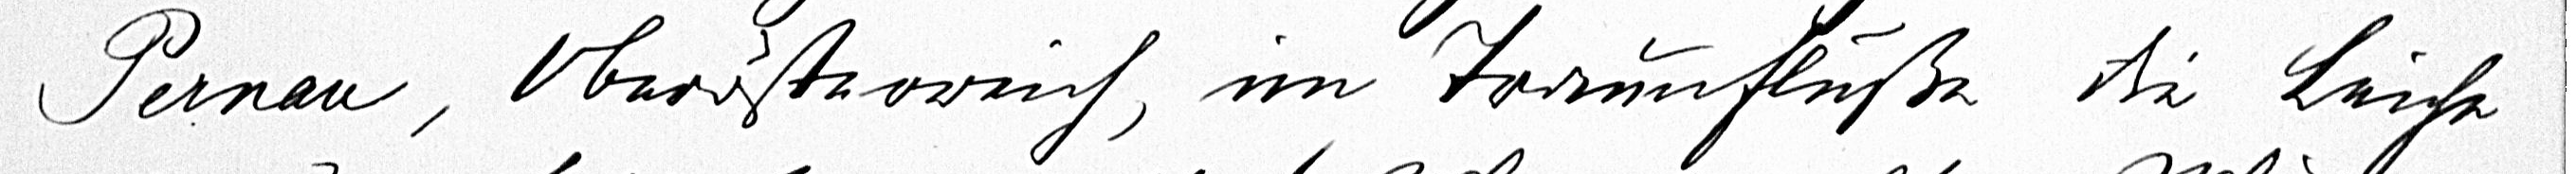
Pernau, Oberösterreich, im Traunfluße die Leiche
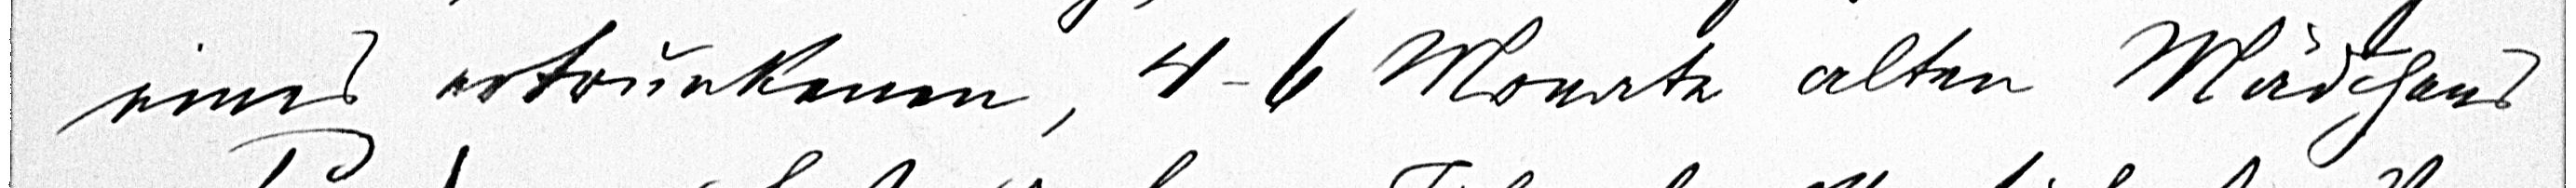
eines ertrunkenen, 4-6 Monate alten Mädchens
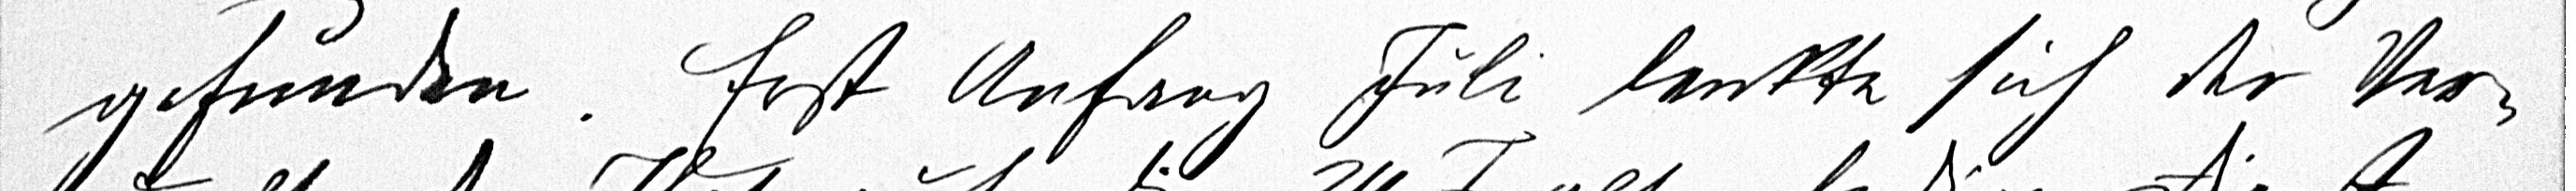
gefunden. Erst Anfang Juli lenkte sich der Ver¬
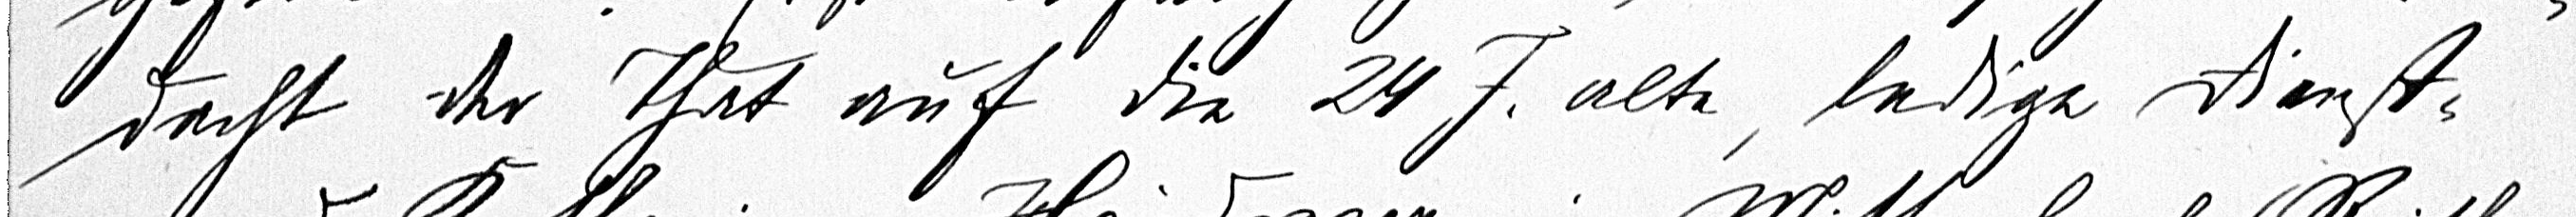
dacht der That auf die 24 J. alte, ledige Dienst¬
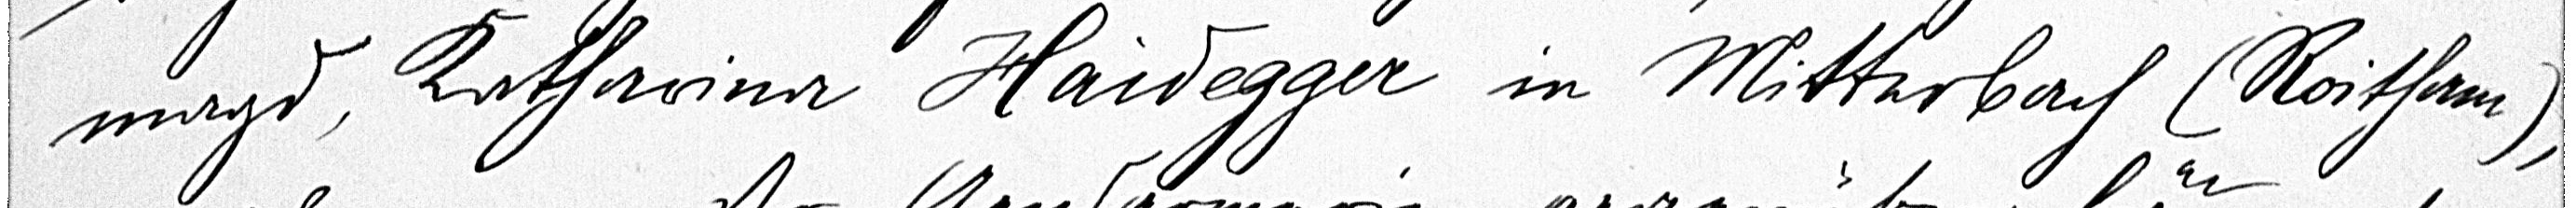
magd, Katharina Haidegger in Mitterbach (Roitham),
